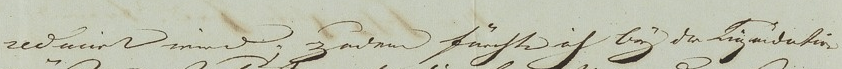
reducirt wird; zudem fürchte ich bey der Liquidation
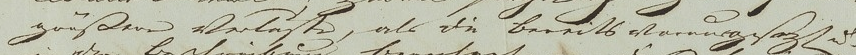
größere Verluste, als die bereits vorausgesezten u..
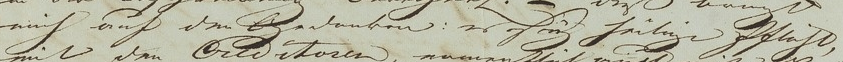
mich auf den Gedanken: es sey heilige Pflicht,
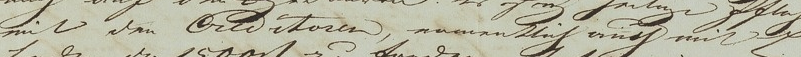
mit den Creditoren, namentlich auch mit Herrn
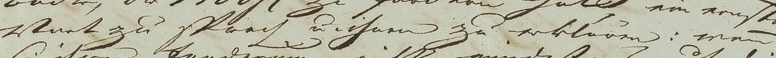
Wort zu sprechen u. ihnen zu erklären: wenn
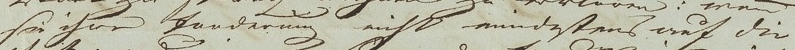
sie ihre Forderung nicht mindestens auf die
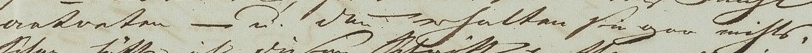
antreten – u. dann erhalten sie gar nichts.
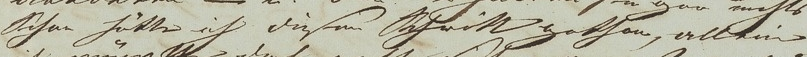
Schon hätte ich diesen Schritt gethan, allein
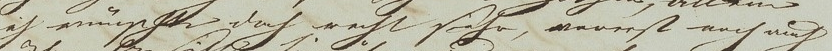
ich wünschte doch recht sehr, vorerst noch auch
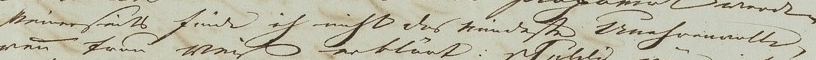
Meinerseits finde ich nicht das mindeste Unehrenvolle,
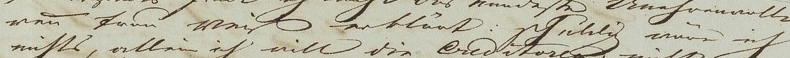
wenn Frau Weiß erklärt: schuldig wäre ich
